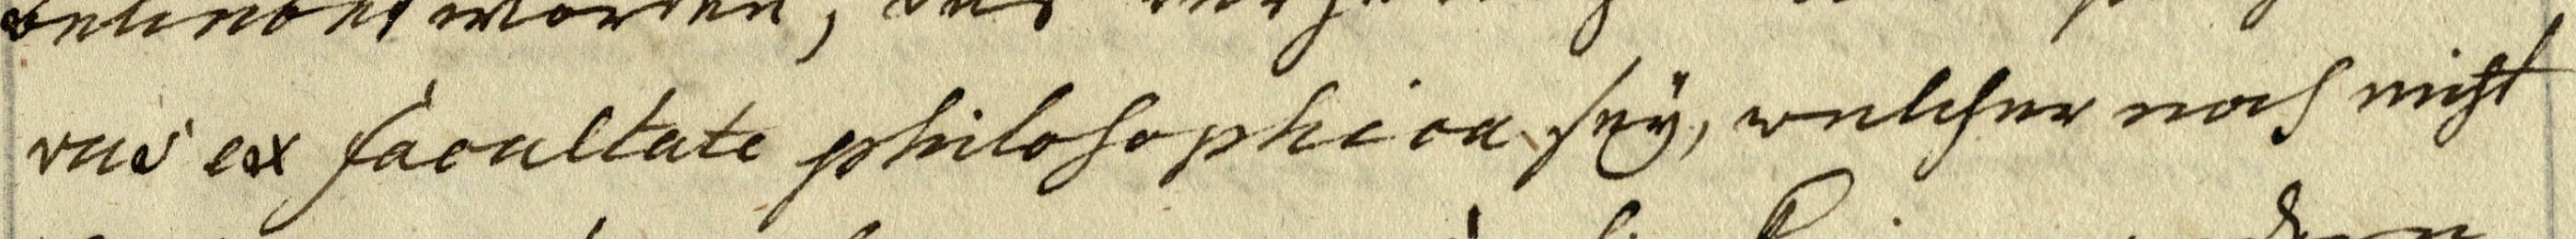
vus ex facultate philosophica seÿ, welcher noch nicht
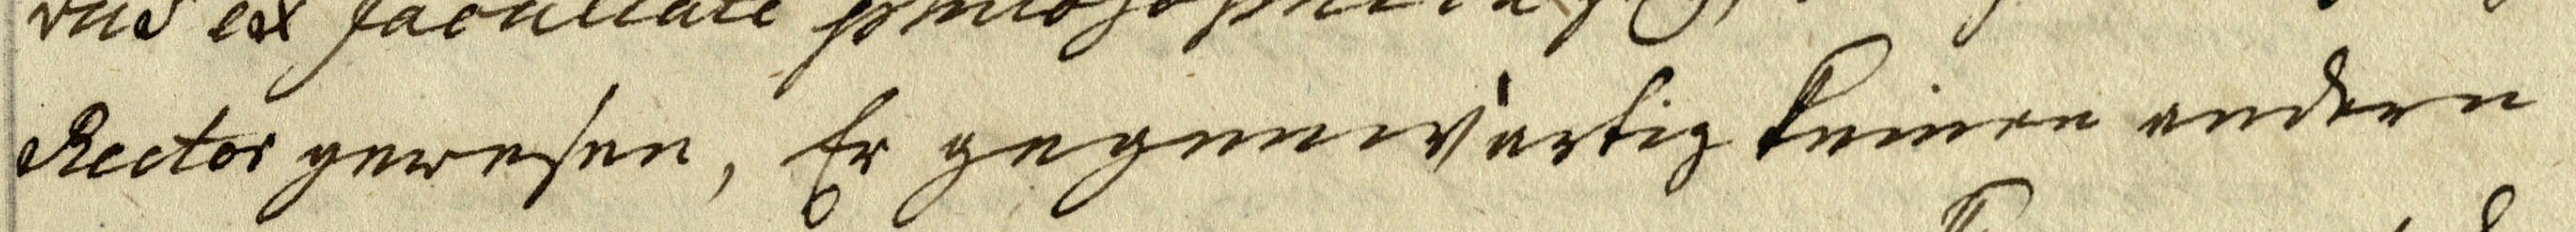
Rector gewesen, Er gegenwärtig keinen andern
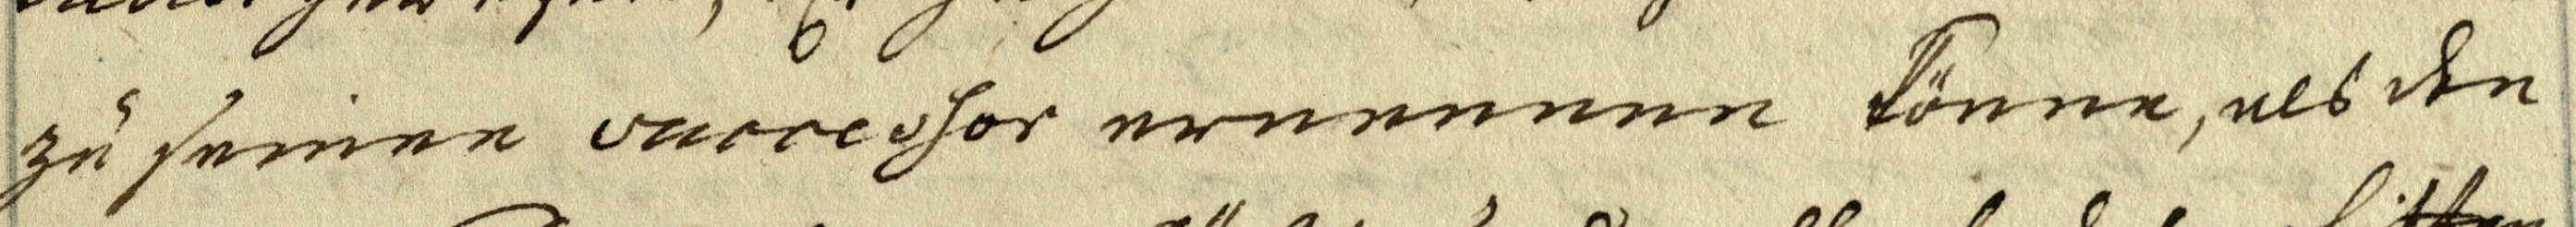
zu seinen successor ernennen könne, als den
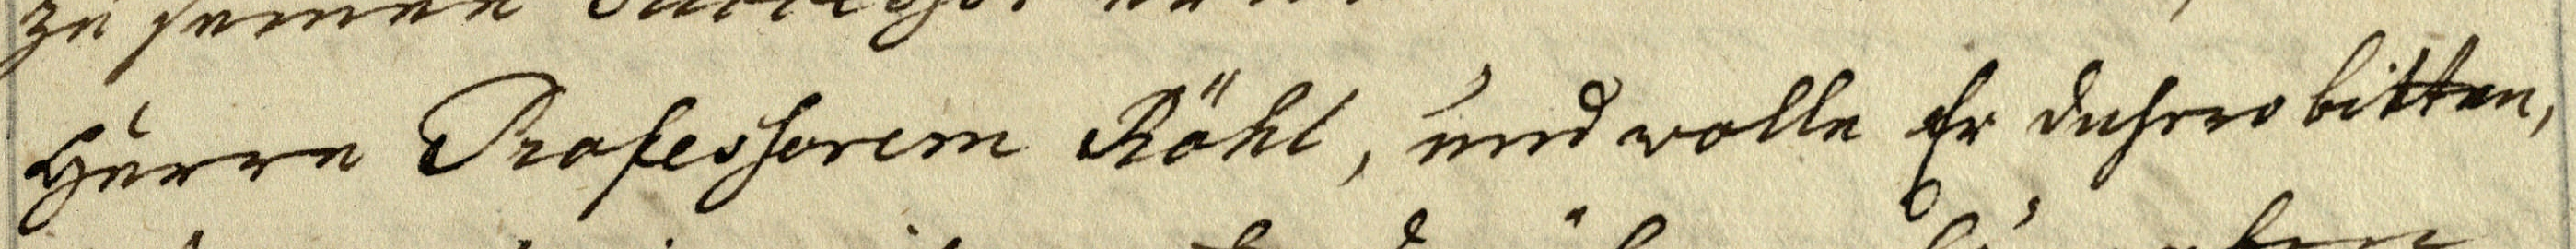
Herrn Professorem Röhl, und wolle Er dahero bitten,
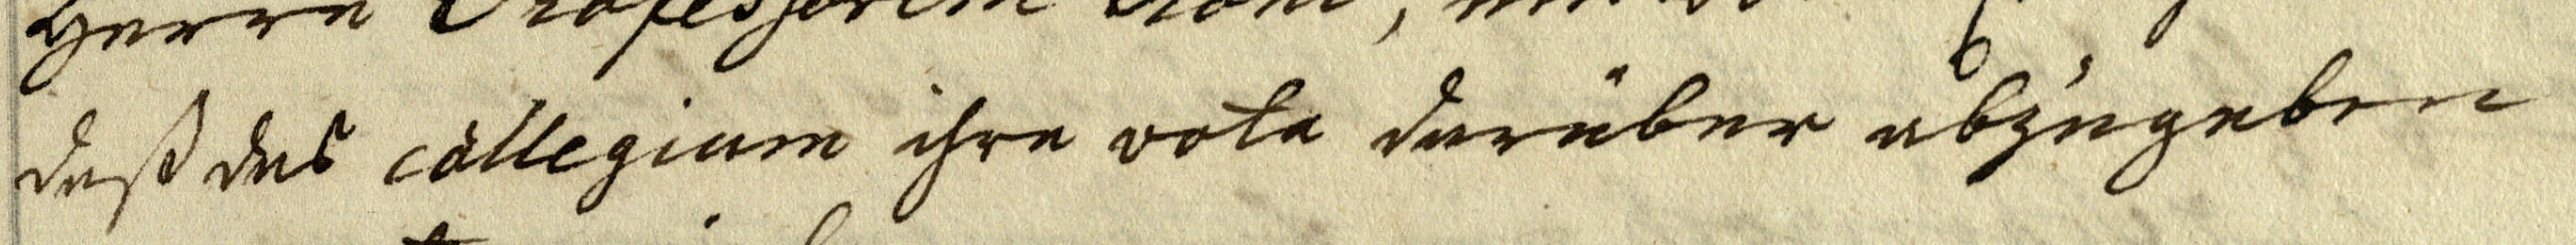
daß das collegium ihre vota darüber abzugeben
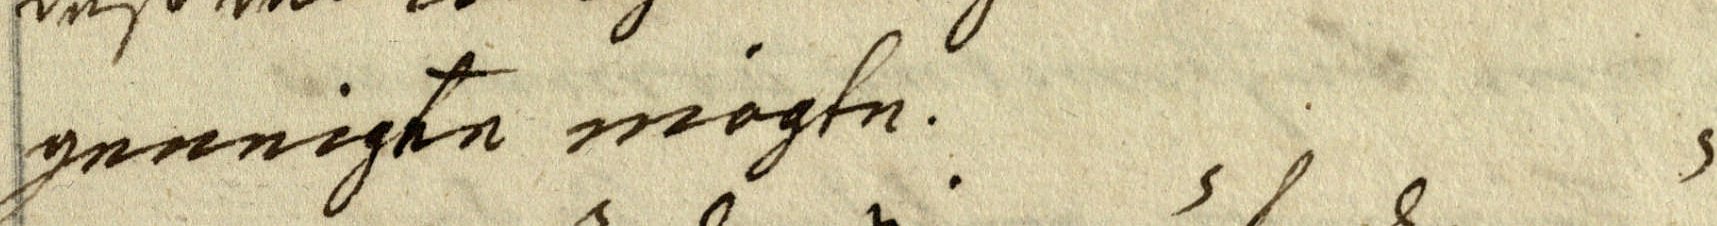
geneigen mögte.
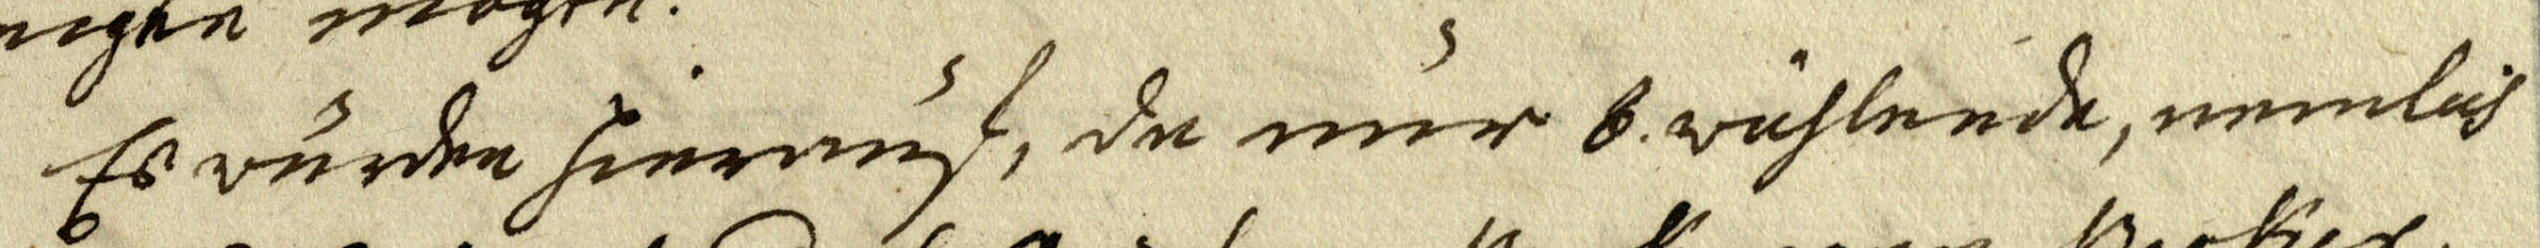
Es wurde hierauf, da nur 8. wählende, nemlich
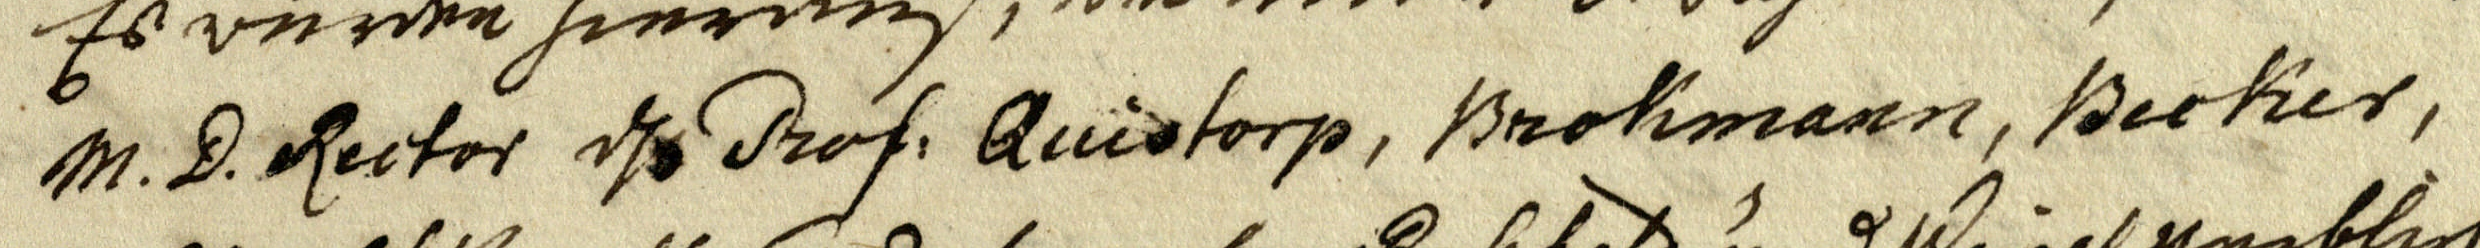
M. D. Rector dh Prof. Quistorp, Brokmann Becker,
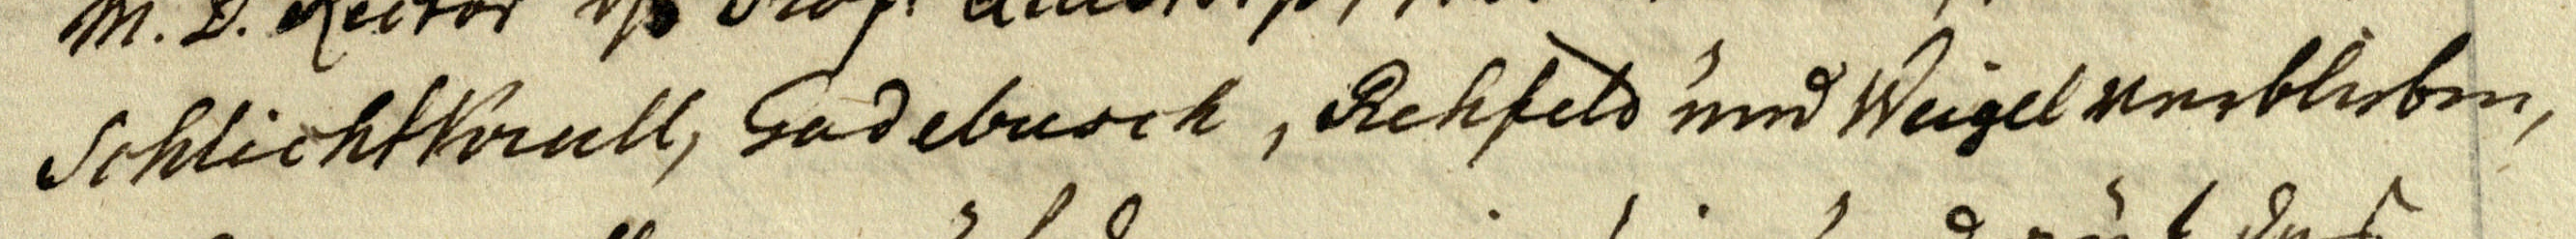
Schlichtkrull, Gadebusch, Rehfeld und Weigel verblieben,
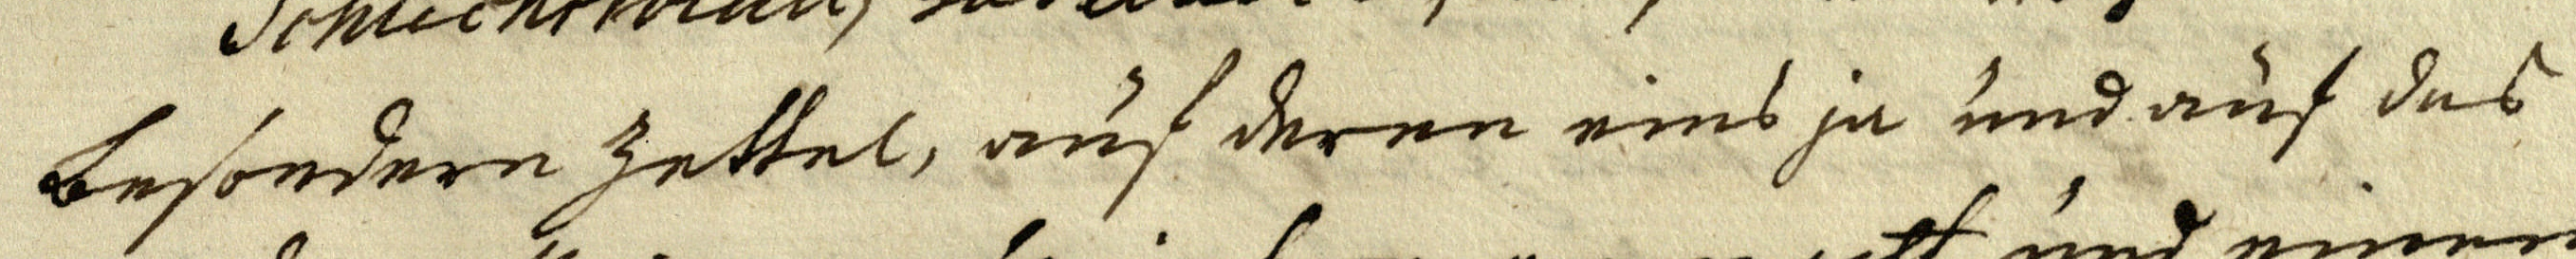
besondere Zettel, auf deren eins ja und auf das
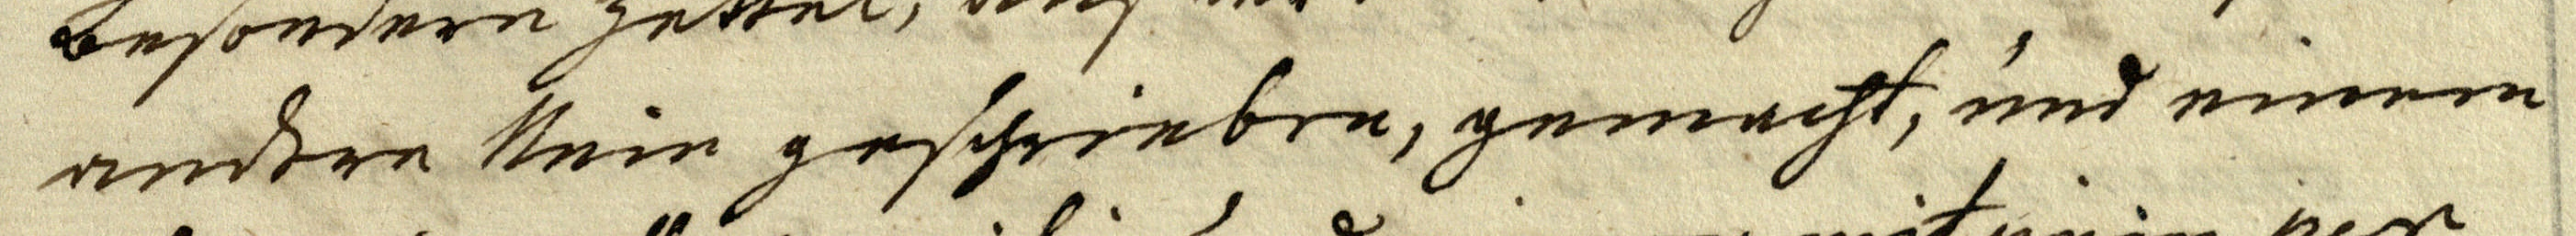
andere Nein geschrieben, gemacht, und einem
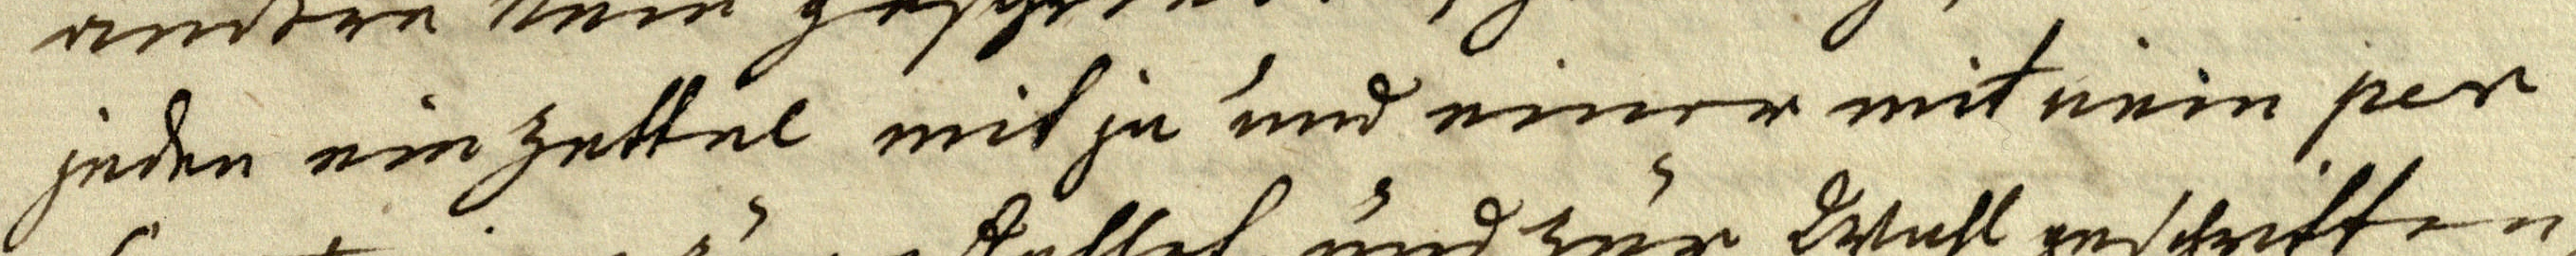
jeden ein Zettel mit ja und einer mit nein per
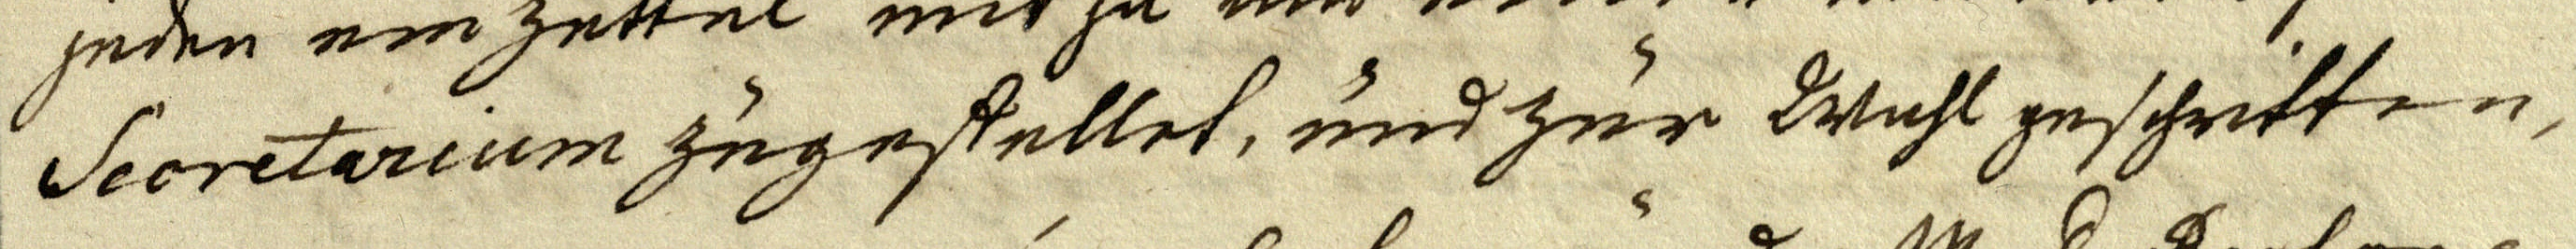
Secretarium zugestellet, und zur Wahl geschritten,
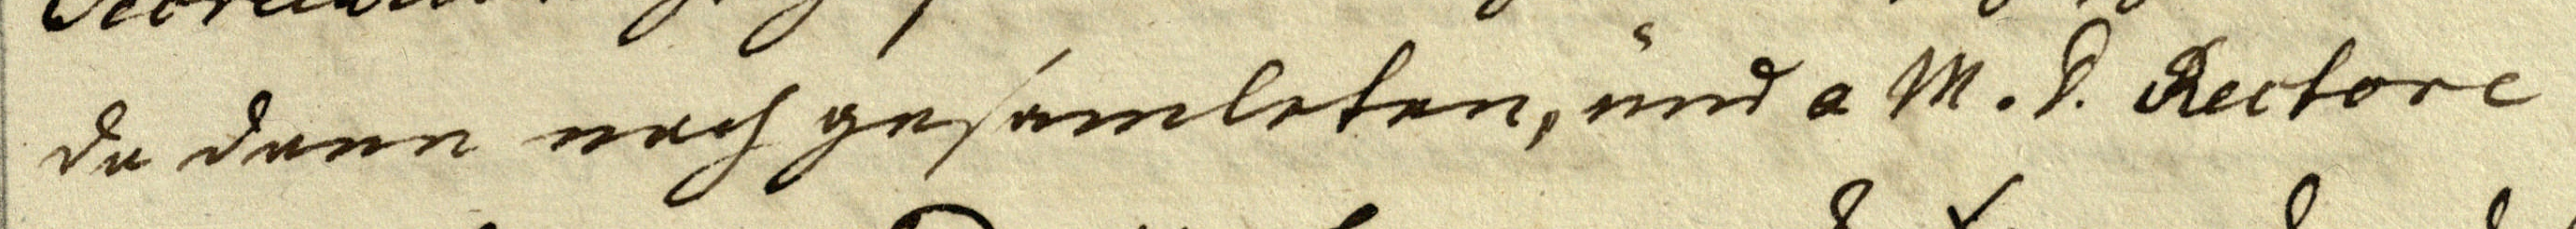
da dann nach gesamleten, und a M. D. Rectore
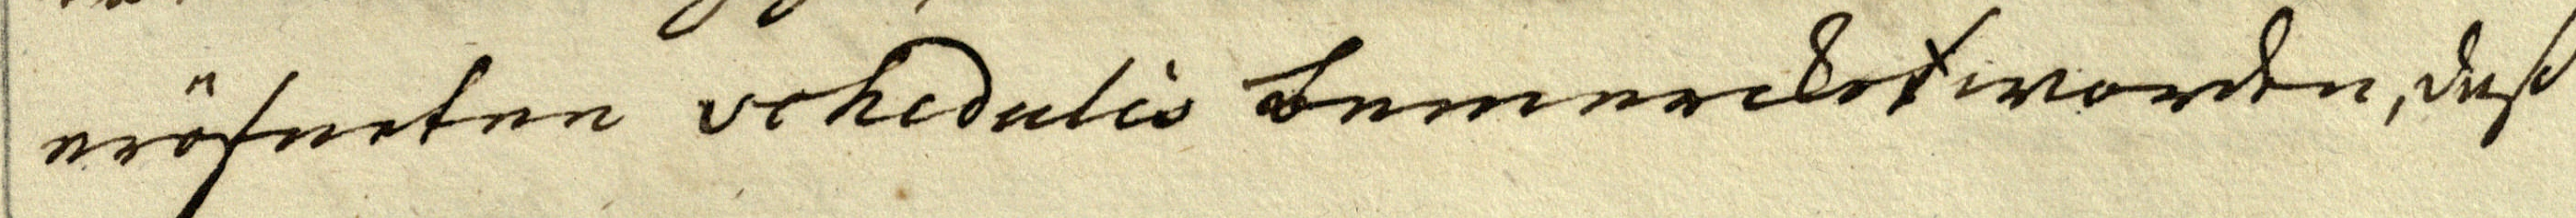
eröfneten schedulis bemercket worden, daß
